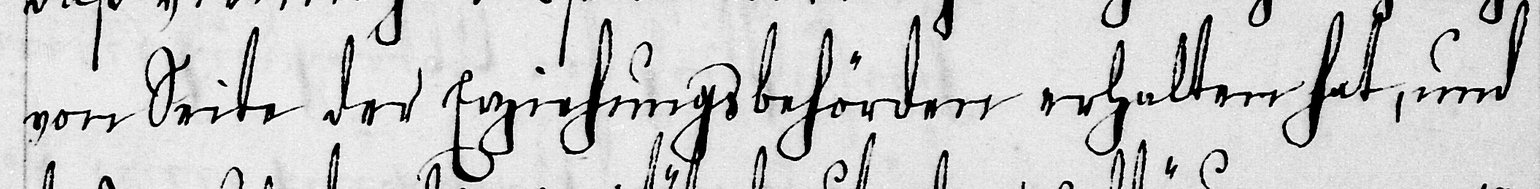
von Seite der Erziehungsbehörden erhalten hat, und
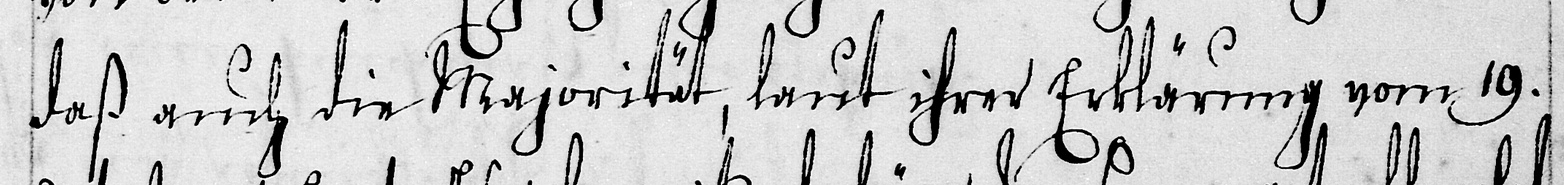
daß auch die Majorität, laut ihrer Erklärung vom 19.
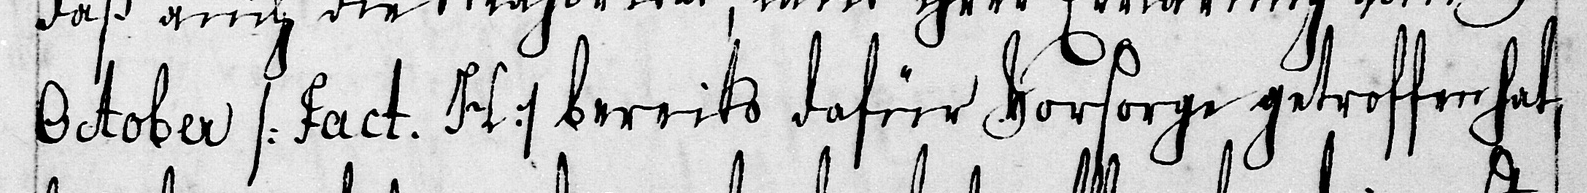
October [Fact. H.] bereits dafür Vorsorge getroffen ha¬
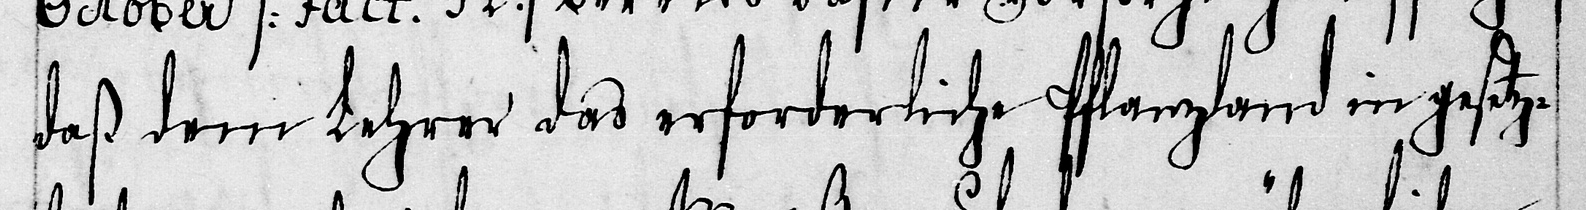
daß dem Lehrer das erforderliche Pflanzland in gesetz¬
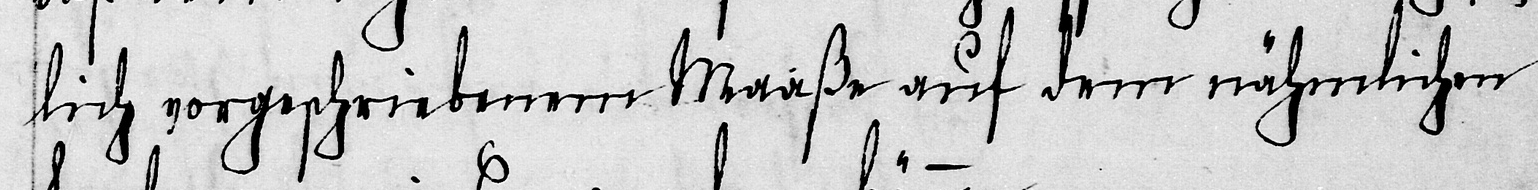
lich vorgeschriebenem Maaße auf dem nähmlichen
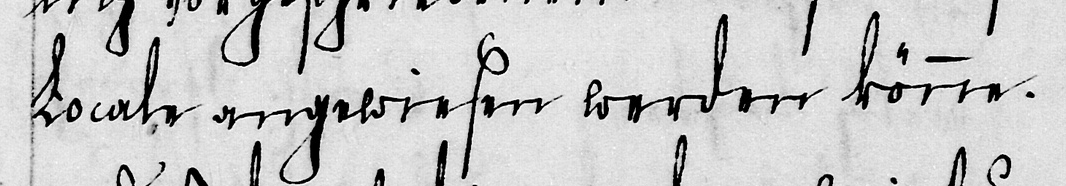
Locale angewiesen werden könne.
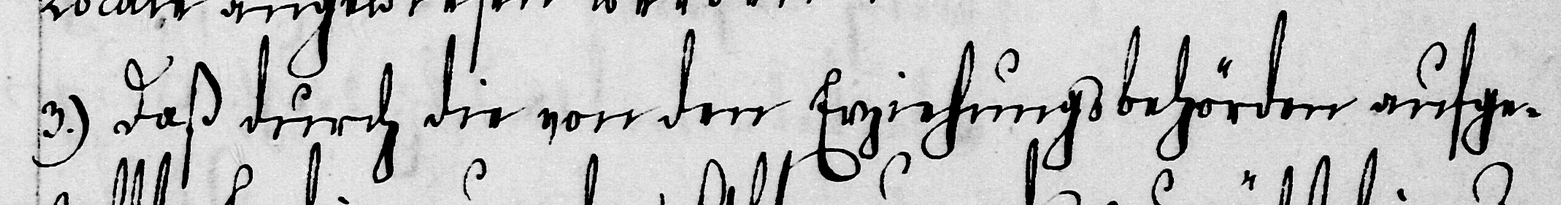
3.) Daß durch die von den Erziehungsbehörden aufge¬
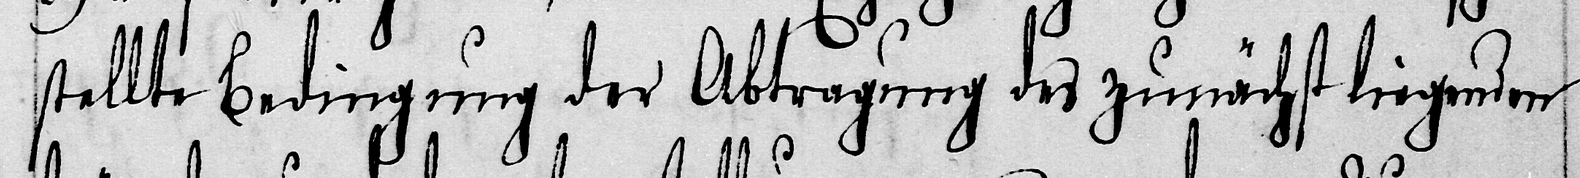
stellte Bedingung der Abtragung des zunächst liegenden
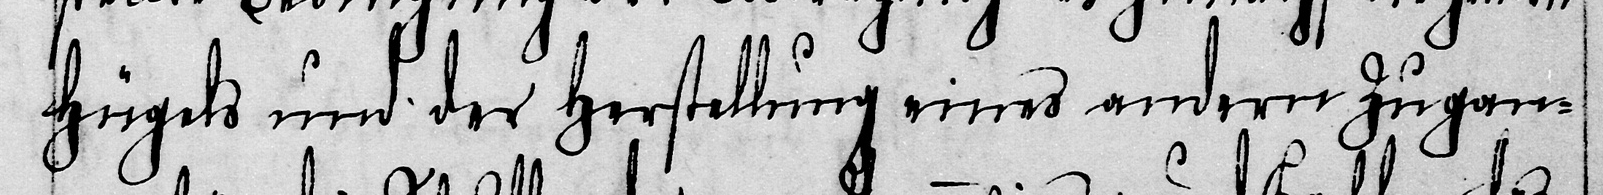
Hügels und der Herstellung eines andern Zugan¬
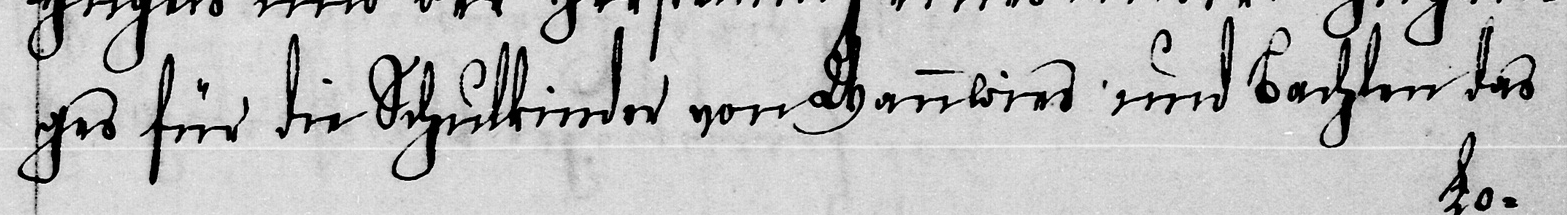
ges für die Schulkinder von Wannwies und Bachlen das
